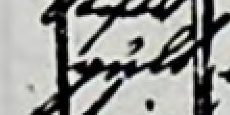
gütt
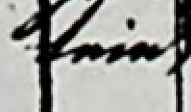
lein
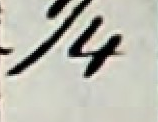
1/4
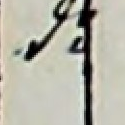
Do
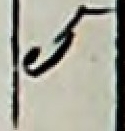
5
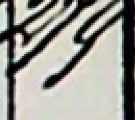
279
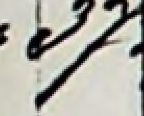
37
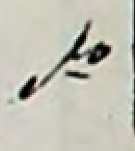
Do
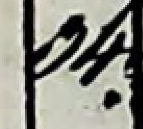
34
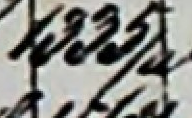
1335/a
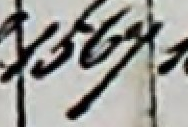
1567
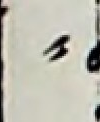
„
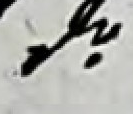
Do
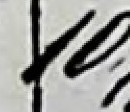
10
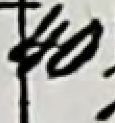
40
